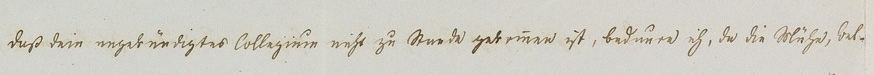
Daß dein angekündigtes Collegium nicht zu Stande gekommen ist, bedaure ich, da die Mühe, wel-
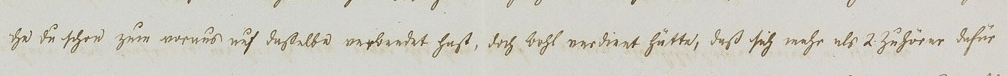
che du schon zum voraus auf dasselbe verwendet hast, doch wohl verdient hätte, daß sich mehr als 2 Zuhörer dafür
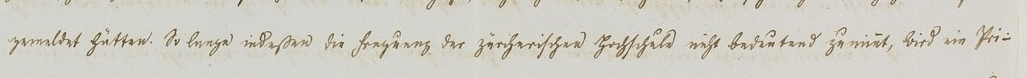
gemeldet hätten. So lange indeßen die Frequenz der zürcherischen Hochschule nicht bedeutend zunimmt, wird ein Pri-
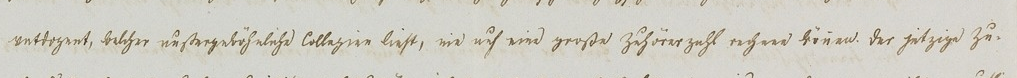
vatdozent, welcher außergewöhnliche Collegien liest, nie auf eine große Zuhörerschaft rechnen können. Der jetzige Zu-
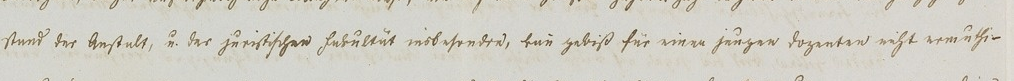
stand der Anstalt, u. der juristischen Fakultät insbesondre, kann gewiß für einen jungen Dozenten nicht ermuthi-
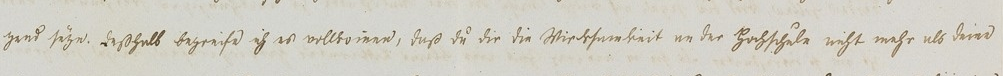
gend seyn. Deßhalb begreife ich es vollkommen, daß du dir die Wirksamkeit an der Hochschule nicht mehr als deine
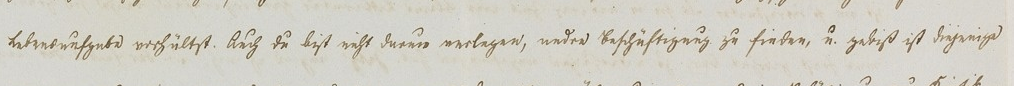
Lebensaufgabe vorhältst. Auch du bist nicht darum verlegen, andre Beschäftigung zu finden, u. gewiß ist diejenige
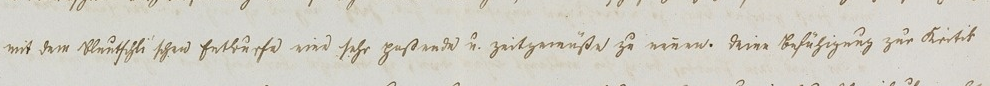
mit dem Blutschli'schen Entwurfe eine sehr paßende u. zeitgemäße zu nennen. Deine Befähigung zur Kritik
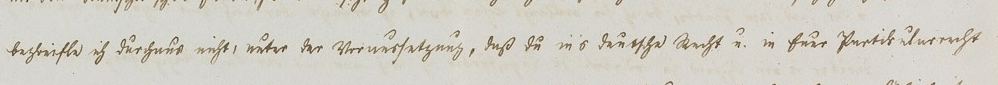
bezweifle ich durchaus nicht, unter der Voraussetzung, daß du in's deutsche Recht u. in Euer Partikularrecht
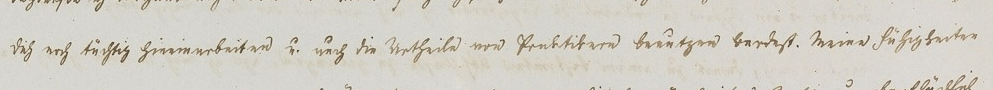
dich noch tüchtig hineinarbeiten u. auch die Urtheile von Praktikern benutzen werdest. Meine Fähigkeiten
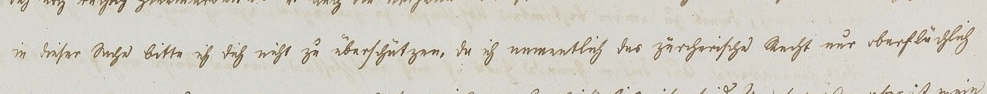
in dieser Sache bitte ich dich nicht zu überschätzen, da ich namentlich das zürcherische Recht nur oberflächlich
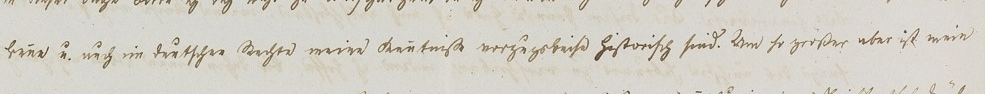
kenne u. auch im deutschen Rechte meine Kenntniße vorzugsweise historisch sind. Um so größer aber ist mein
